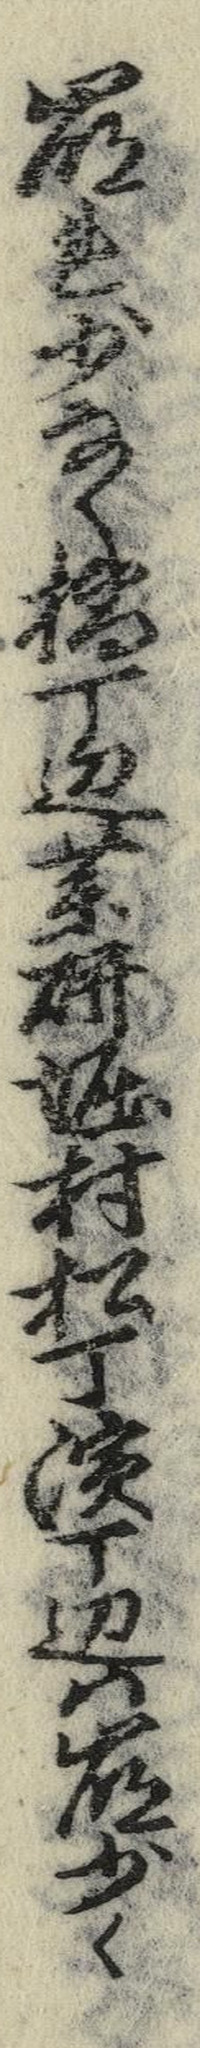崩れ少なく橋丁辺薬研堀村松丁濱丁辺は崩少く
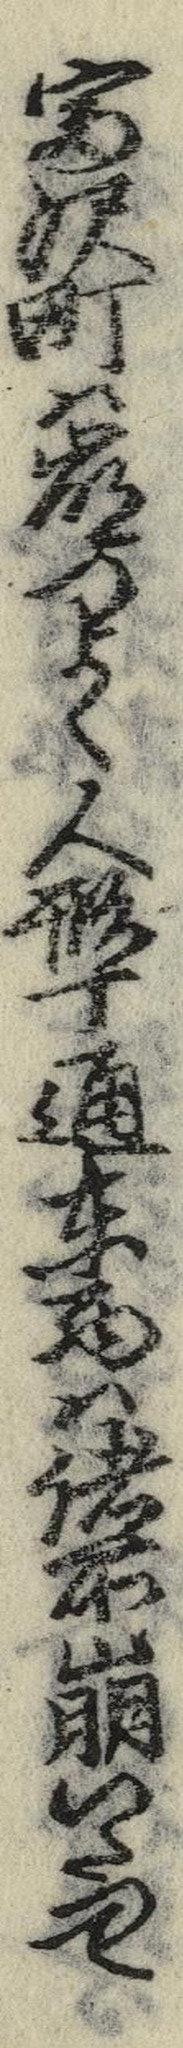富沢町は崩つよく人形丁通り東西は諸所崩いたつて
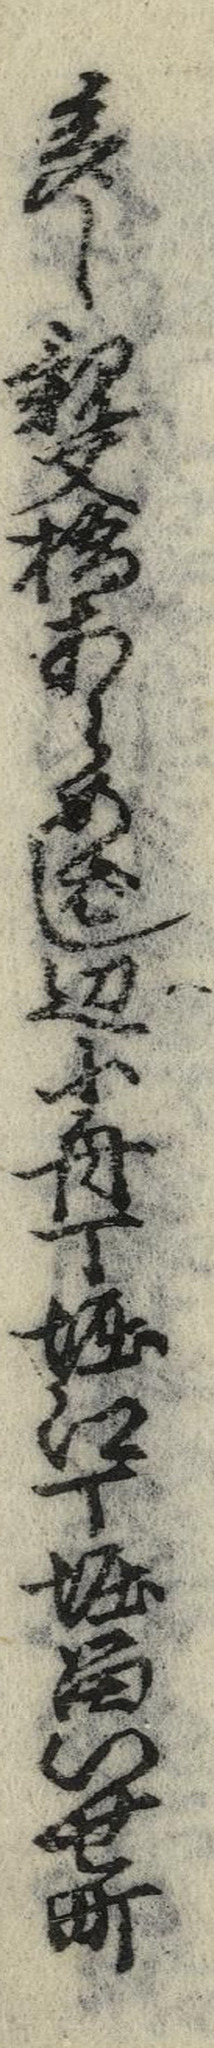多し親父橋あらめばし辺小舟丁堀江丁堀留いせ町
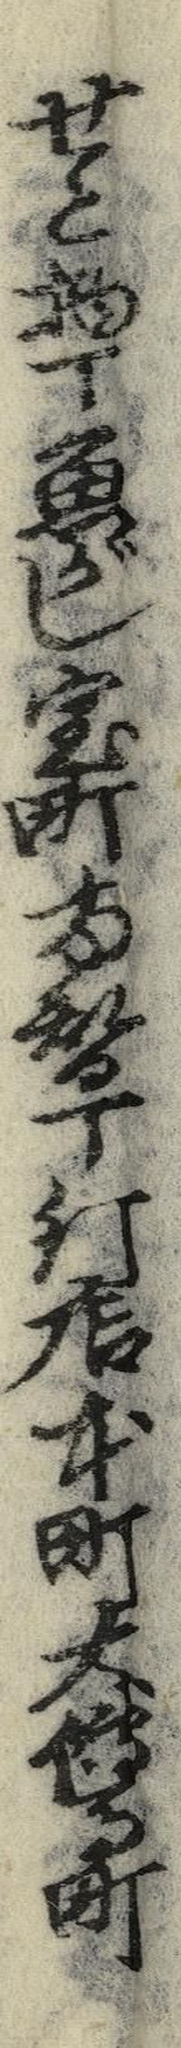せと物丁魚がし宝町両替丁釘店本町大伝馬町
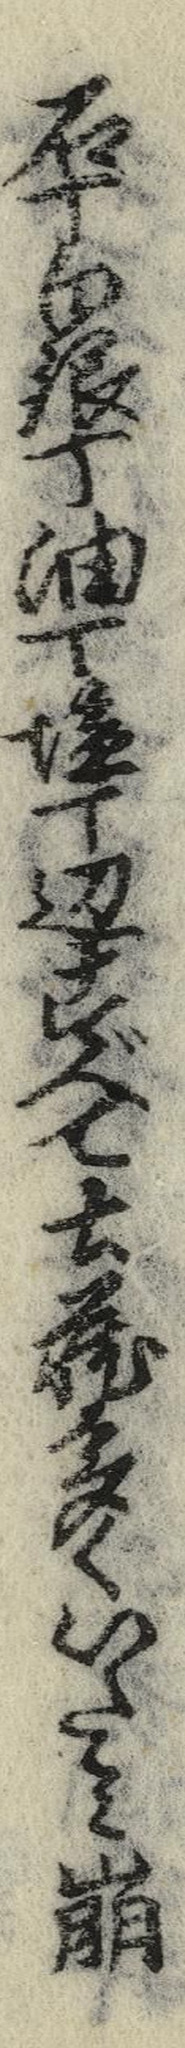石丁白銀丁油丁塩丁辺すべて土蔵多くいたみ崩
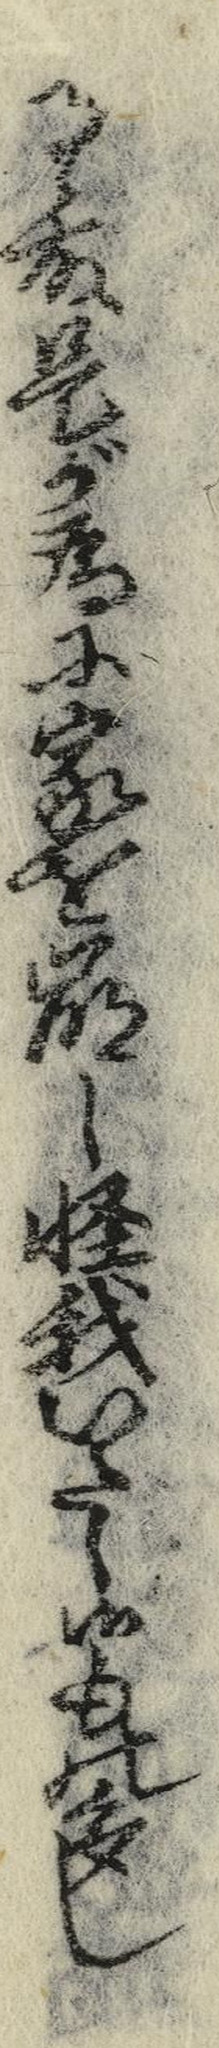るゝ故是が為に家を崩し怪我いたし候もの多し
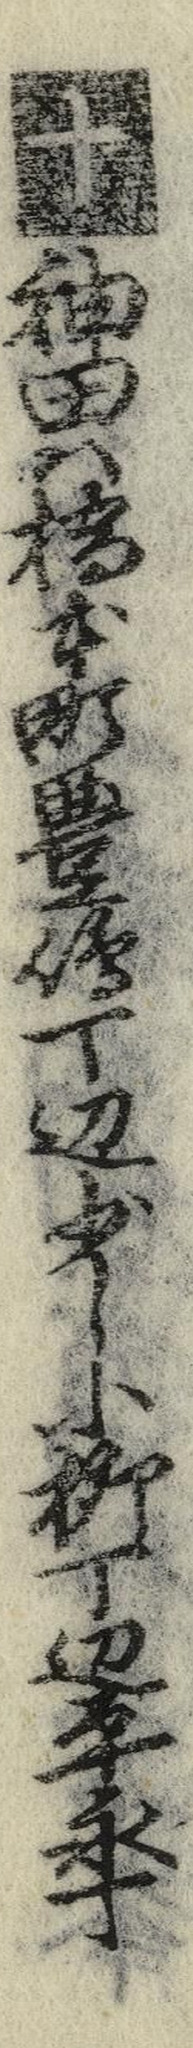十神田は橋本町豊嶋丁辺少し小柳丁辺平永丁
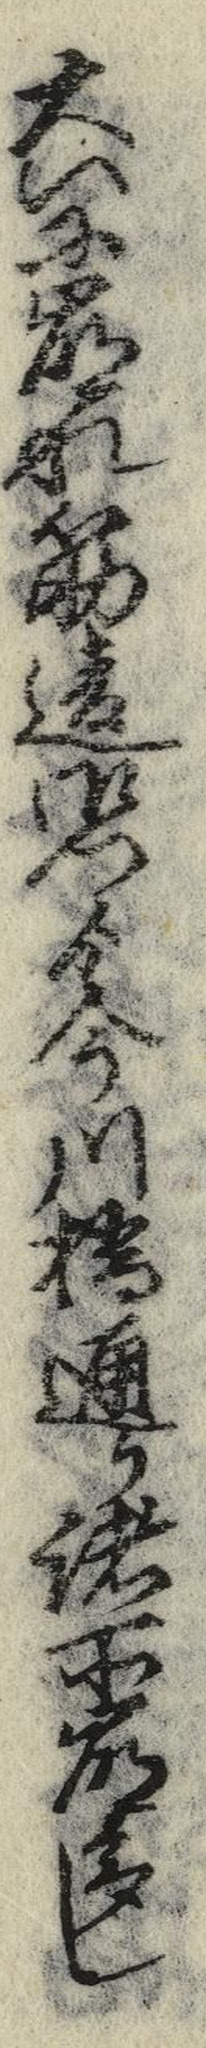大いに崩れ筋違御門ゟ今川橋通り諸所崩多し
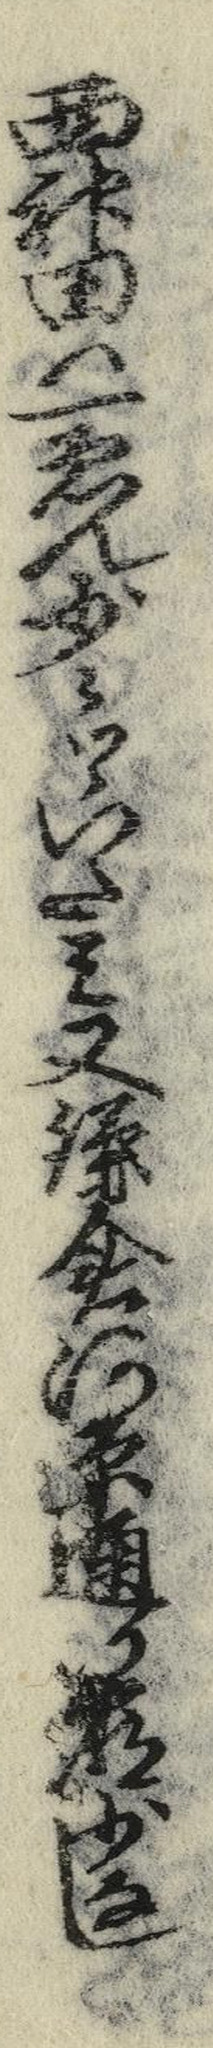西神田は一ゑん少々つゝいたみ又鎌倉河原通り崩少なし
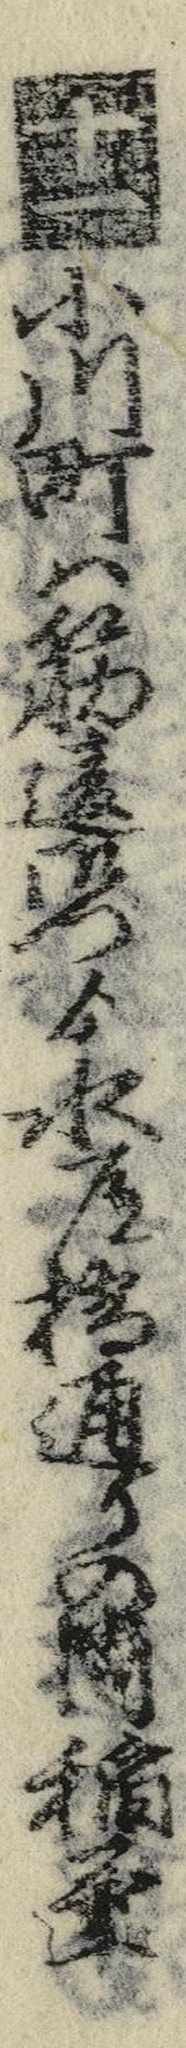十一小川町は筋違御門ゟ水道橋通りの内稲葉
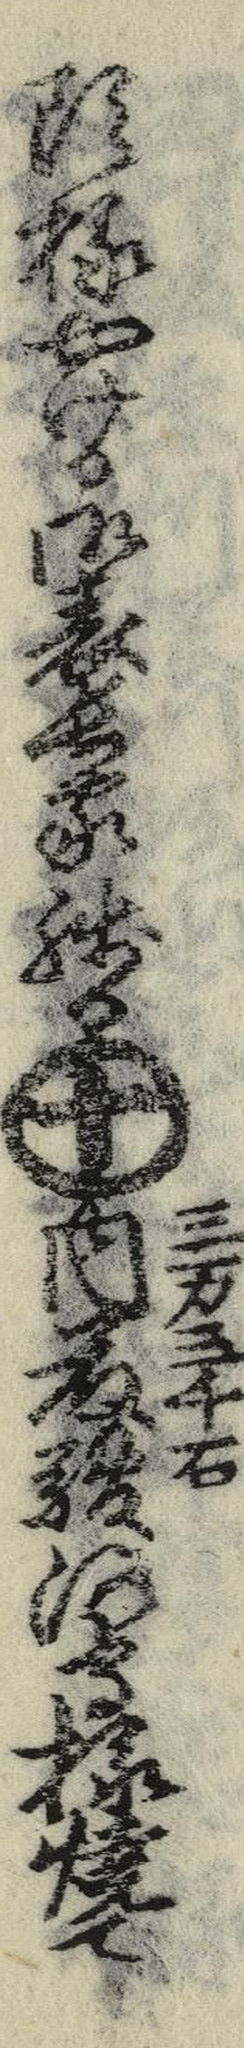頭様やける御表長屋残る内藤駿河守様焼て
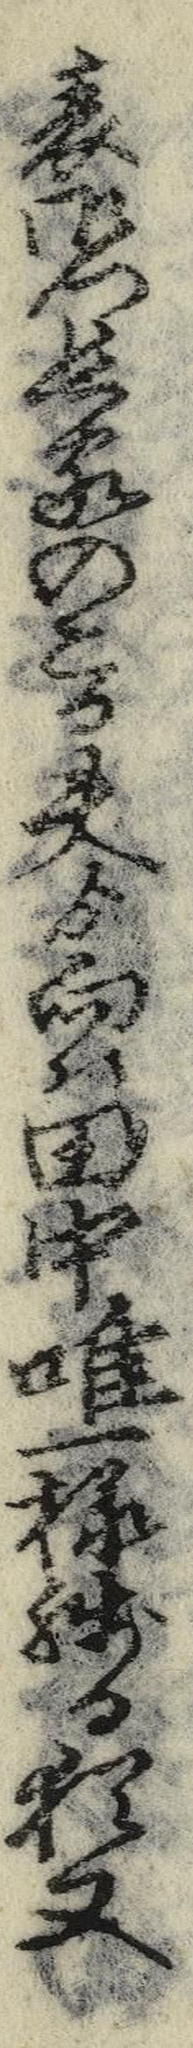表御門長家のこる夫ゟ向ハ田中唯一様残る猶又
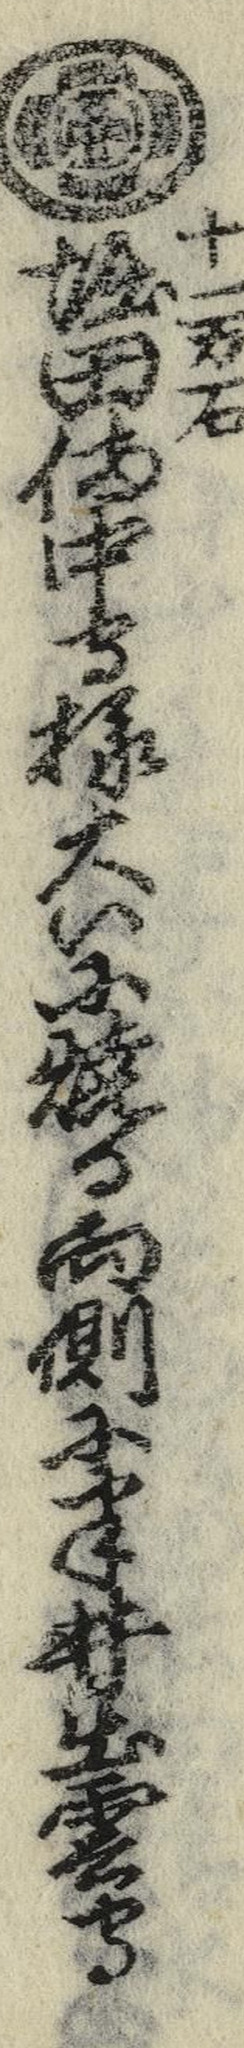堀田備中守様大いに焼る向側に半井出雲守
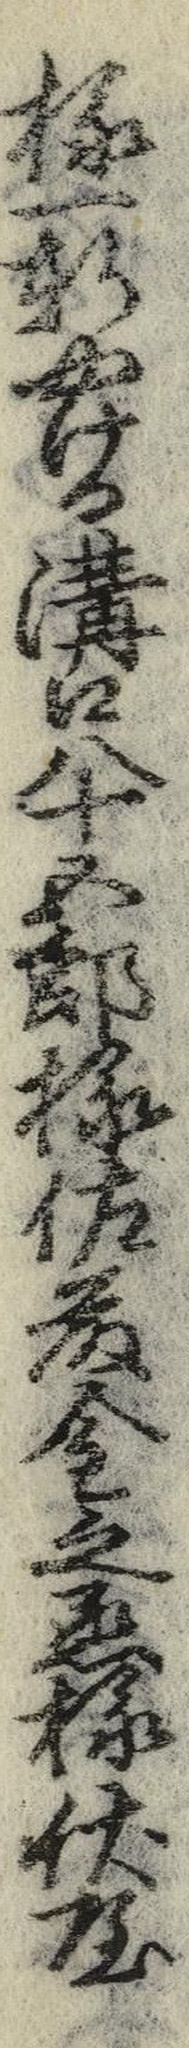様一軒やける溝口八十五郎様佐藤金之丞様伏屋
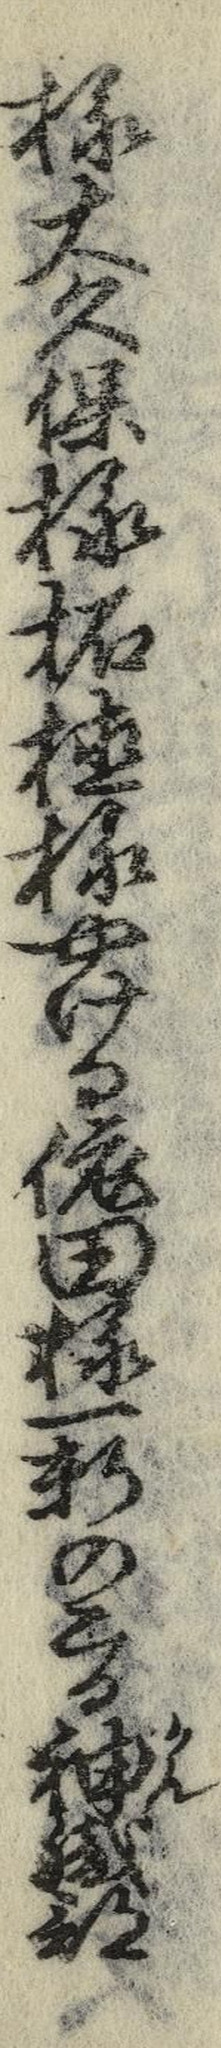様大久保様柘植様やける依田様一軒のこる神織部

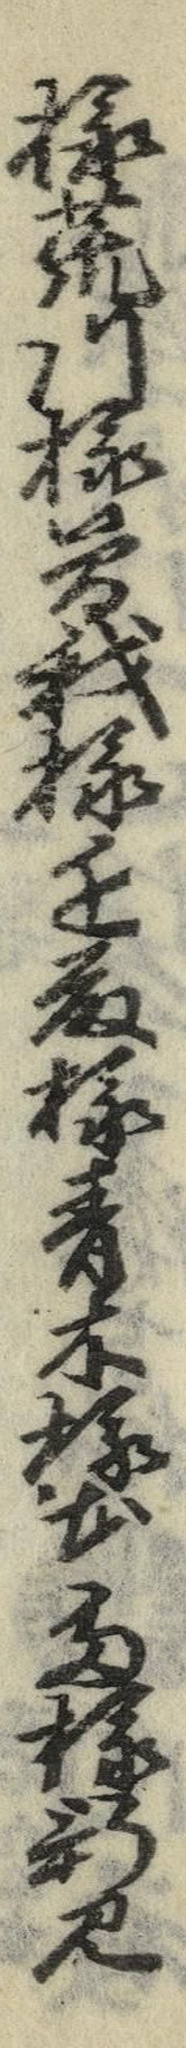様荒川様曽我様近藤様青木様本多様新見
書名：地震類焼場所明細書之写　安政二卯年十月二日夜四ツ時過　御府内御屋敷方市中共、并街道筋近郷聞書
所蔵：東京大学地震研究所図書室 Earthquake Research Institute Library, The University of Tokyo, JAPAN
